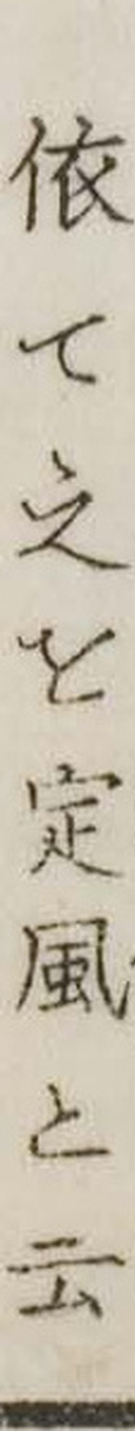依て之を定風と云
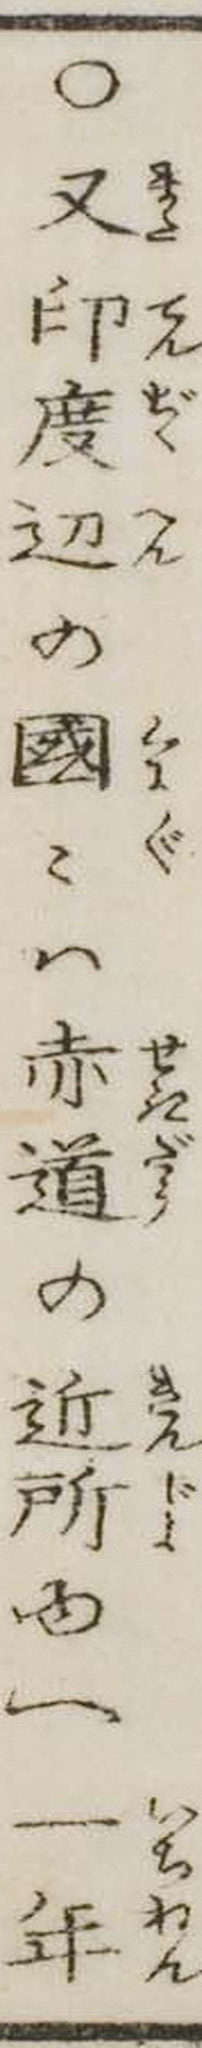◯又印度辺の國〻は赤道の近所ゆへ一年
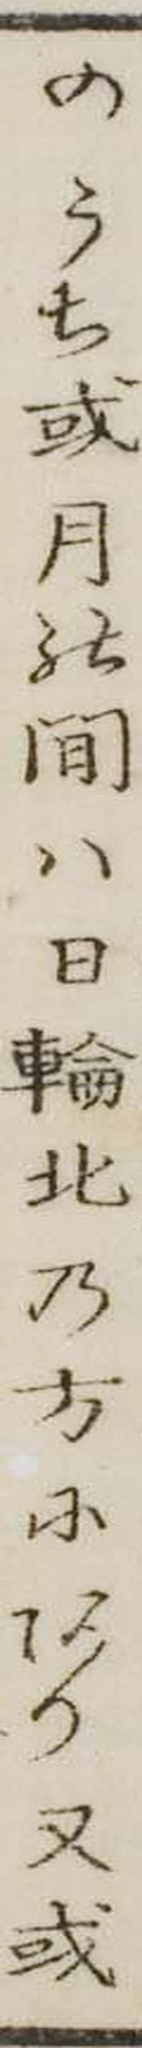のうち或月の間は日輪北の方にあり又或
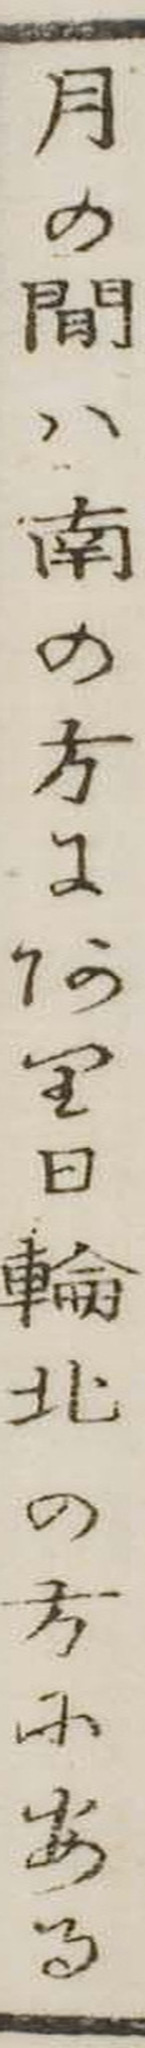月の間は南の方にあり日輪北の方にある
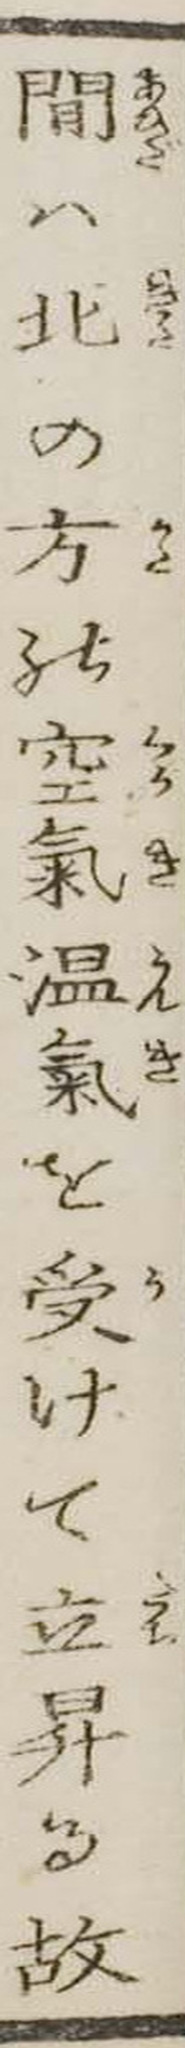間は北の方の空氣温氣を受けて立昇る故
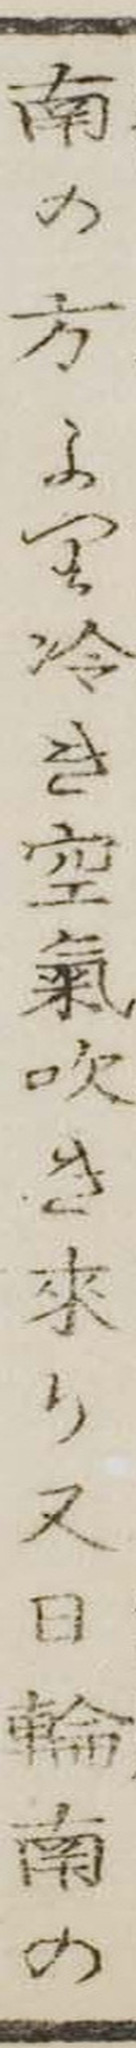南の方より冷き空氣吹き來り又日輪南の
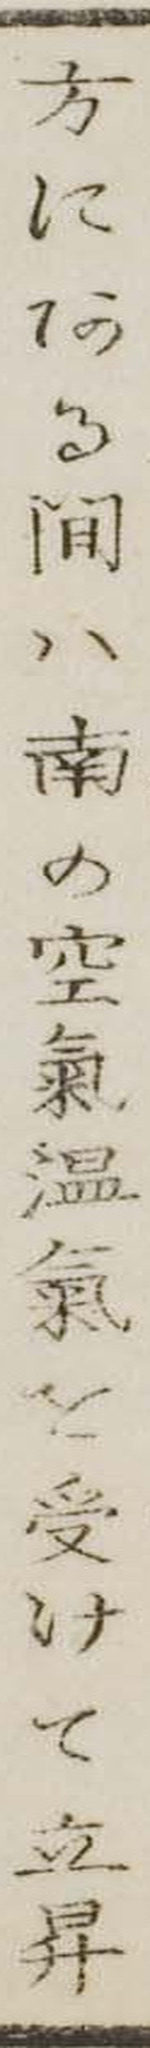方にある間は南の空氣温氣を受けて立昇
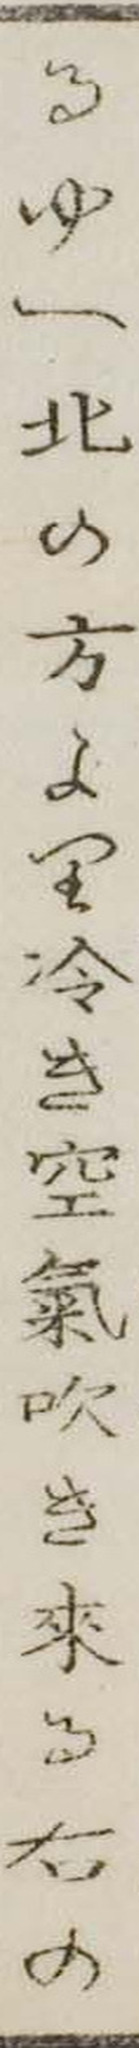るゆへ北の方より冷き空氣吹き來る右の
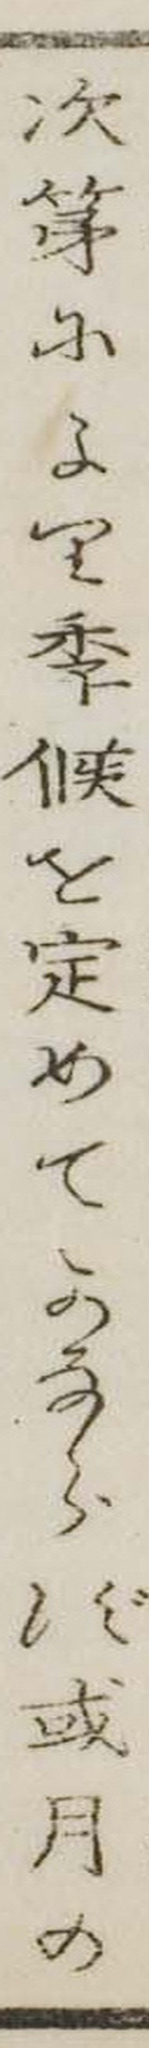次第により季候を定めてかならず或月の
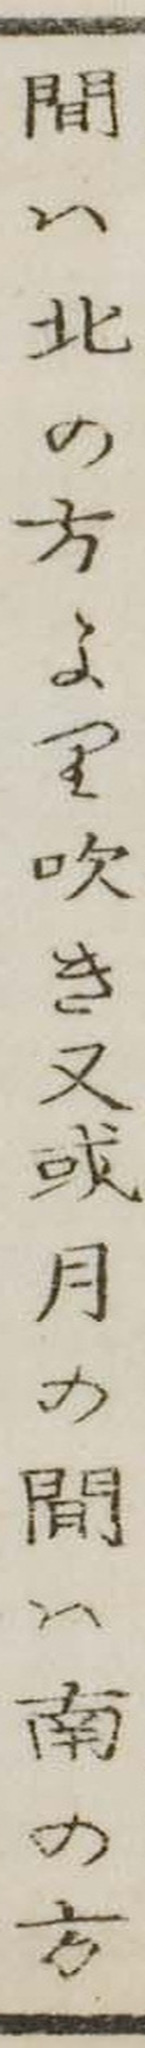間は北の方より吹き又或月の間は南の方
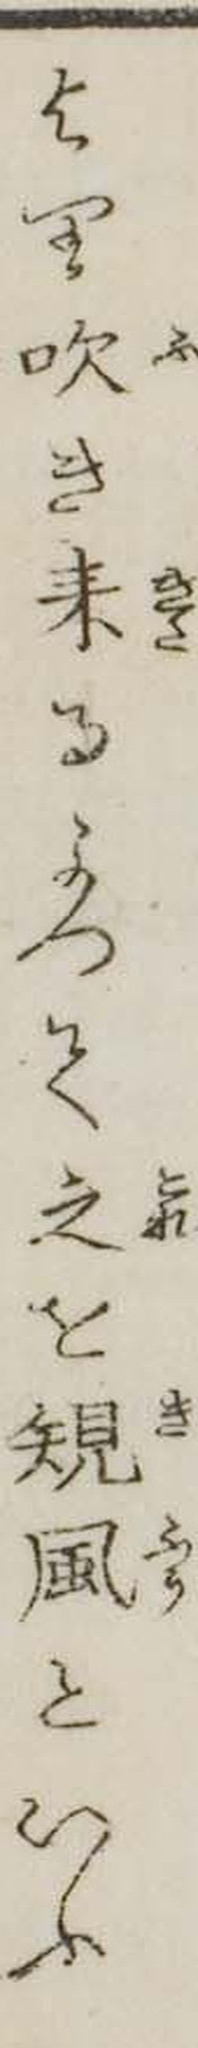より吹き来るよつて之を䂓風といふ
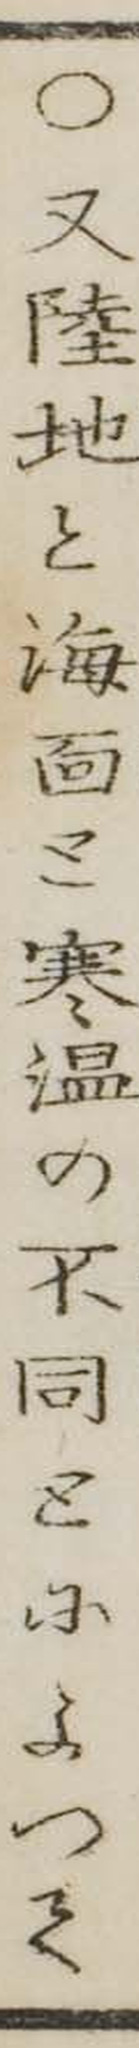◯又陸地と海靣と寒温の不同とによつて

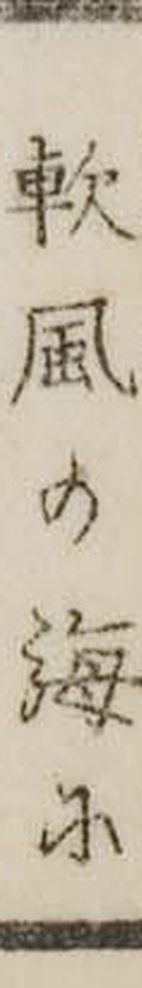軟風の海に
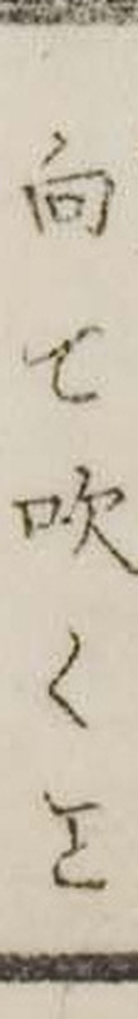向て吹くこと
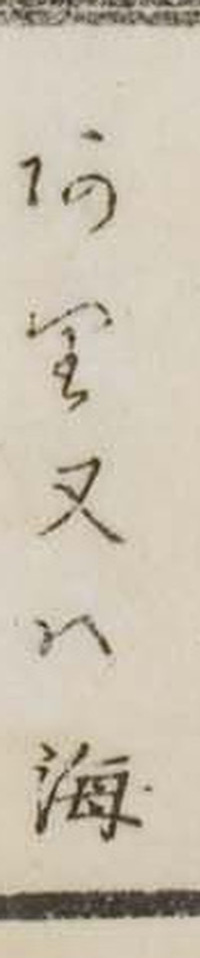あり又は海
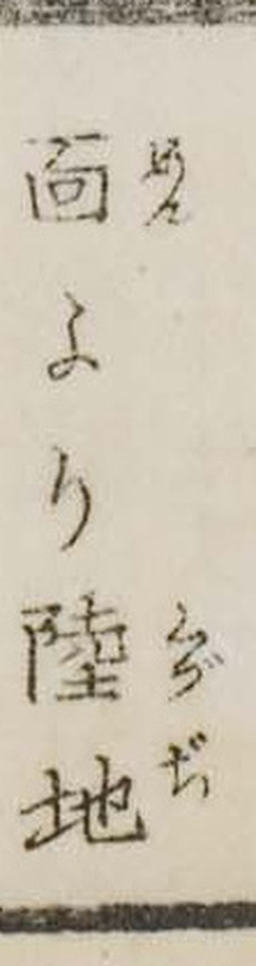靣より陸地
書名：究理知慧の勧 : 訓蒙画入 巻之2
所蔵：東京学芸大学附属図書館
